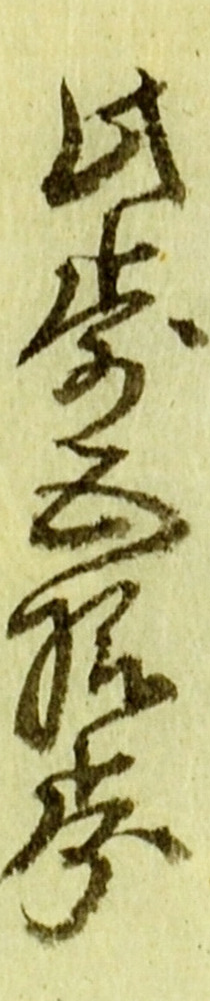此歩五拾歩
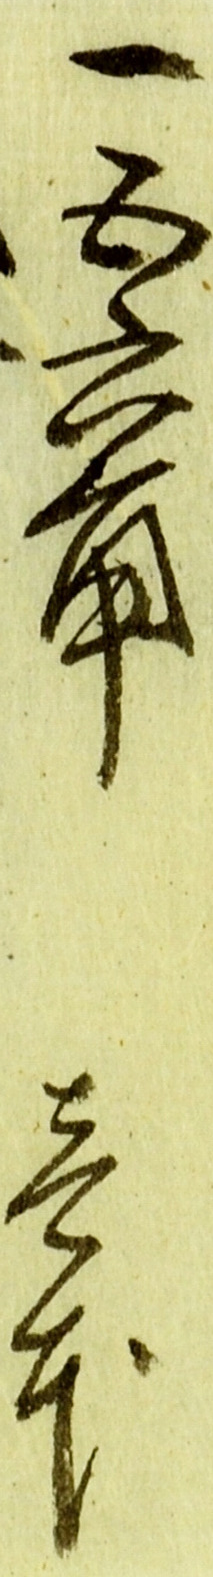一五六角壱本
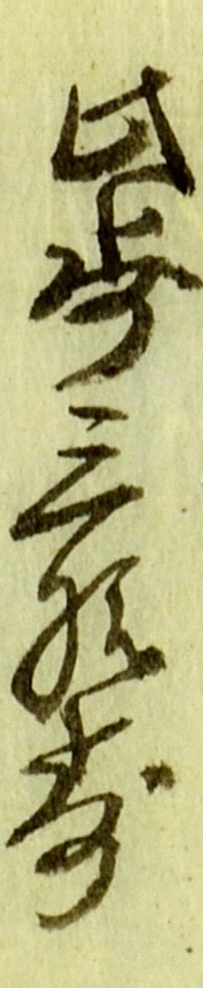此歩三拾歩
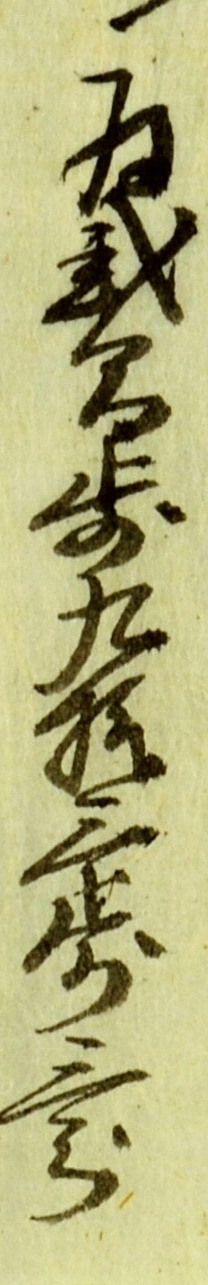為弐間歩九拾三歩三分
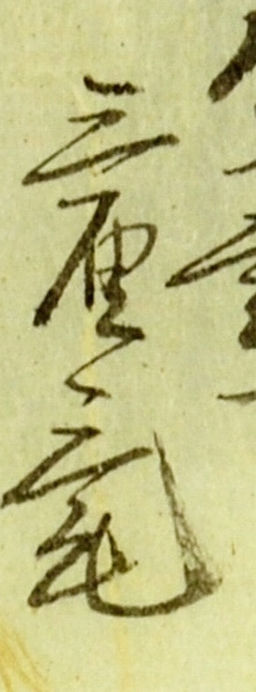三厘三毛

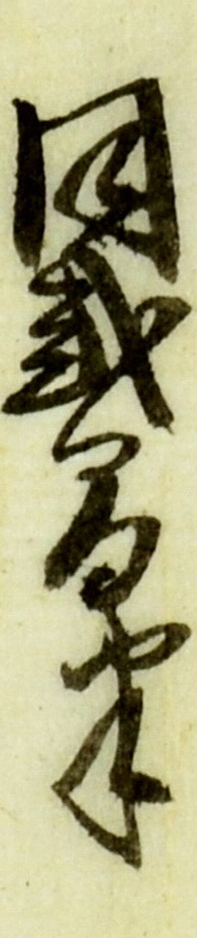同弐間半
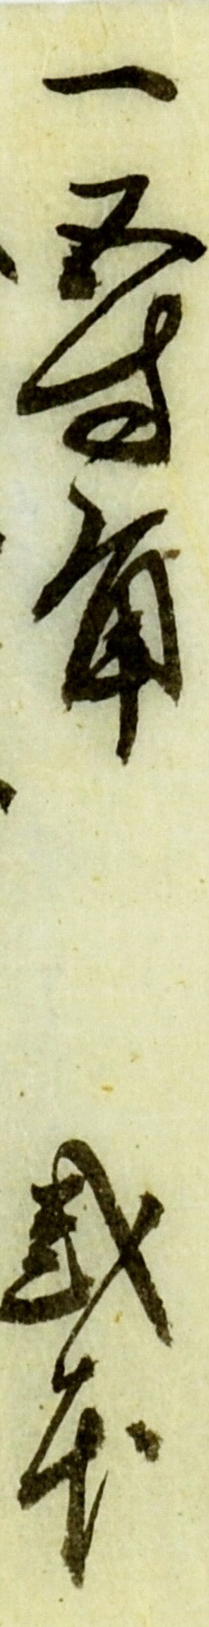一五寸角弐本
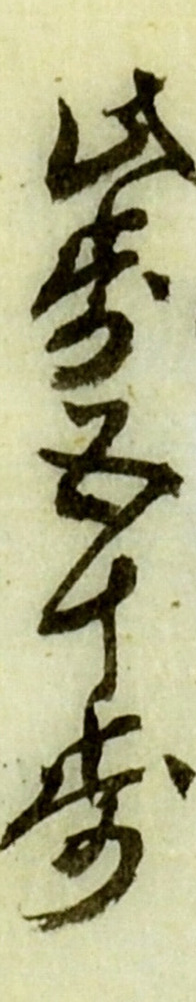此歩五十歩
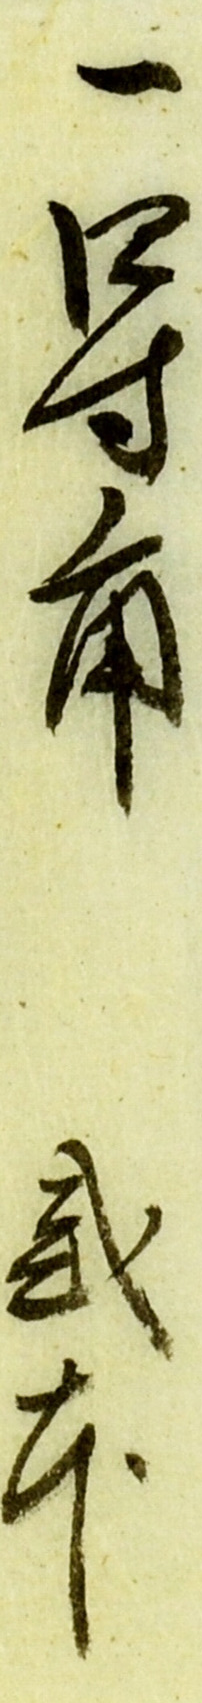一四寸角弐本
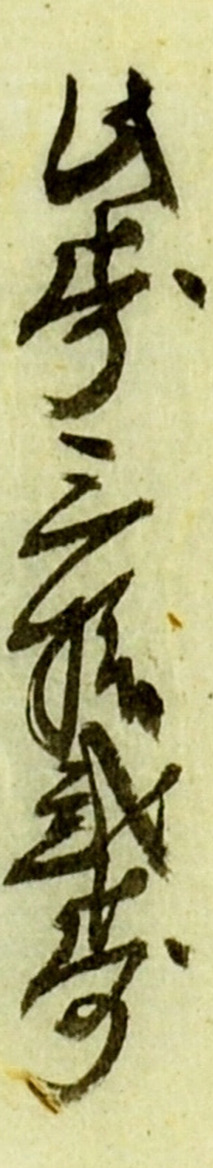此歩三拾弐歩
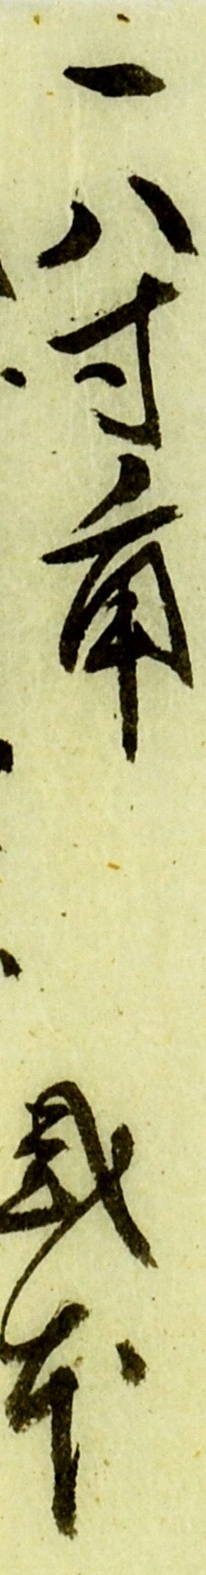一八寸角弐本
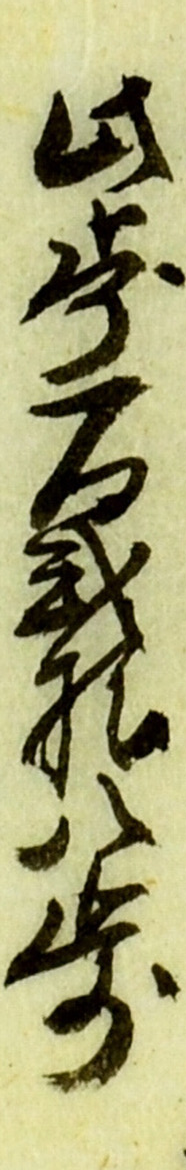此歩百弐拾八歩
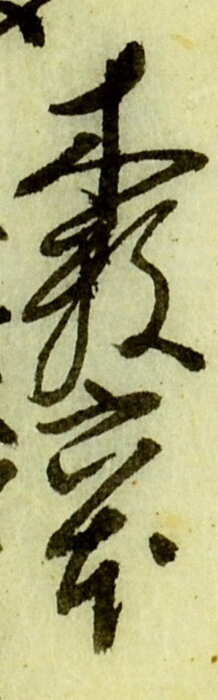木数六本
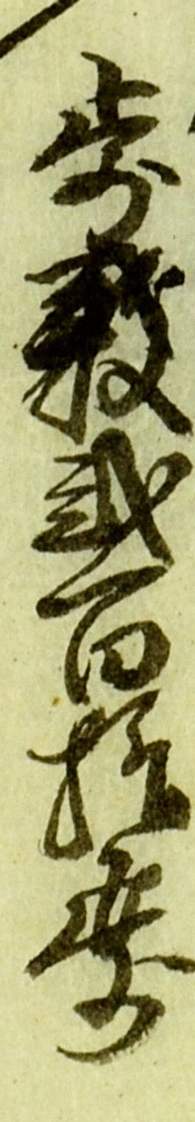〆歩数弐百拾歩
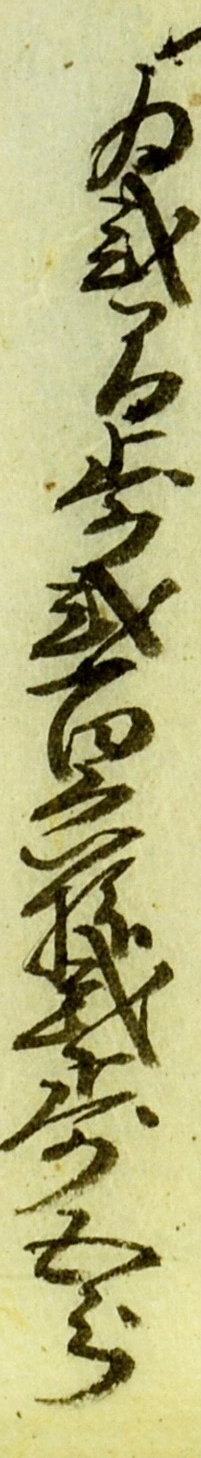為弐間歩弐百六拾弐歩五分
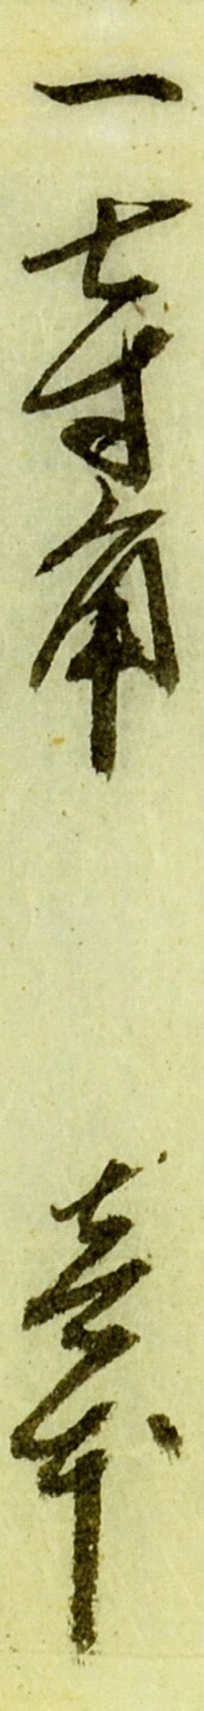一七寸角壱本
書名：材木川下ケ分一上納帳
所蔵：伊那市立高遠町図書館・合同会社AMANE
